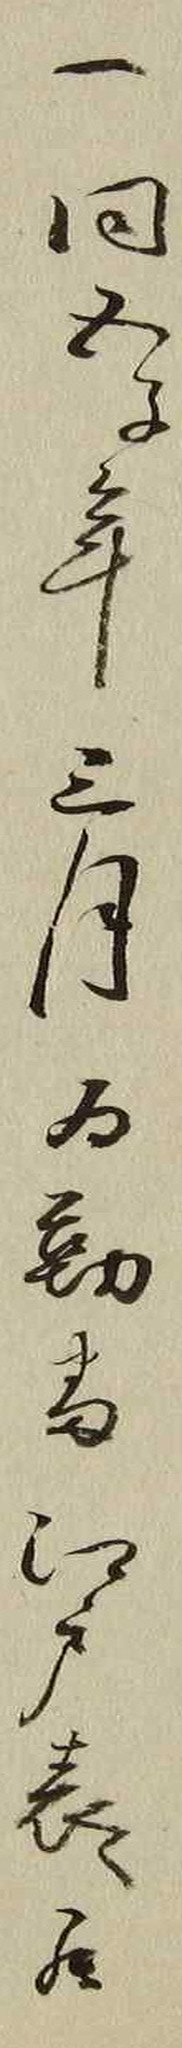一同五子年三月為勤番江戸表へ罷
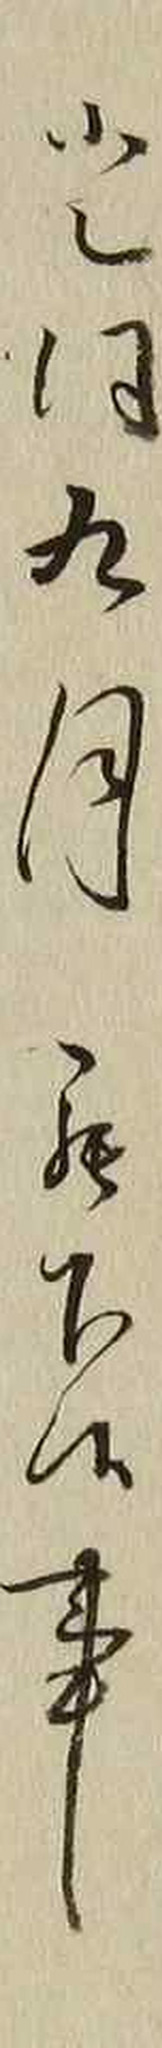登同九月罷下候事
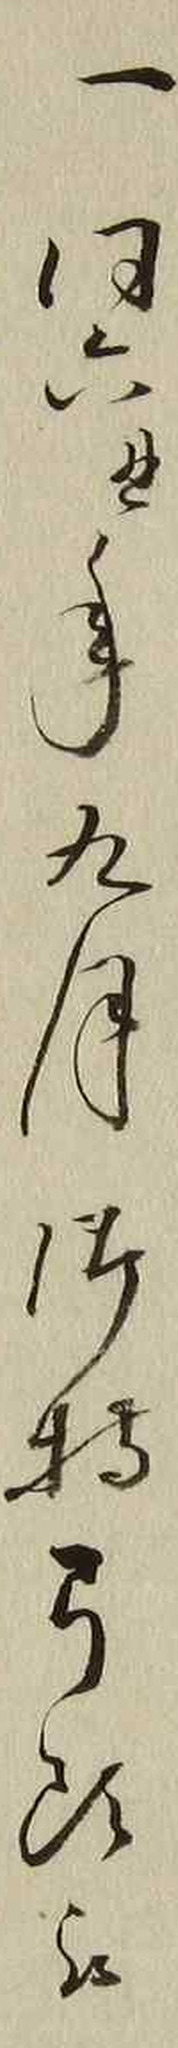一同六丑年九月御持弓頭被
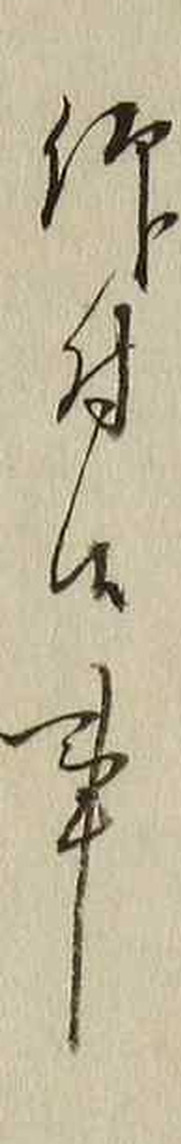仰付候事
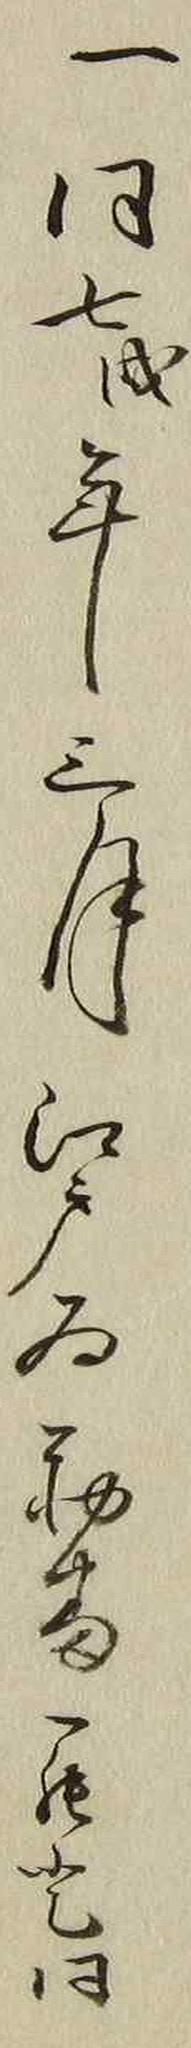一同七戌年三月江戸為勤番罷登同
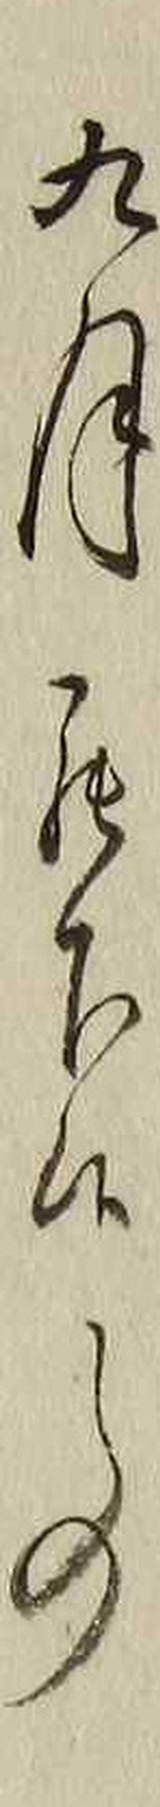九月罷下候事
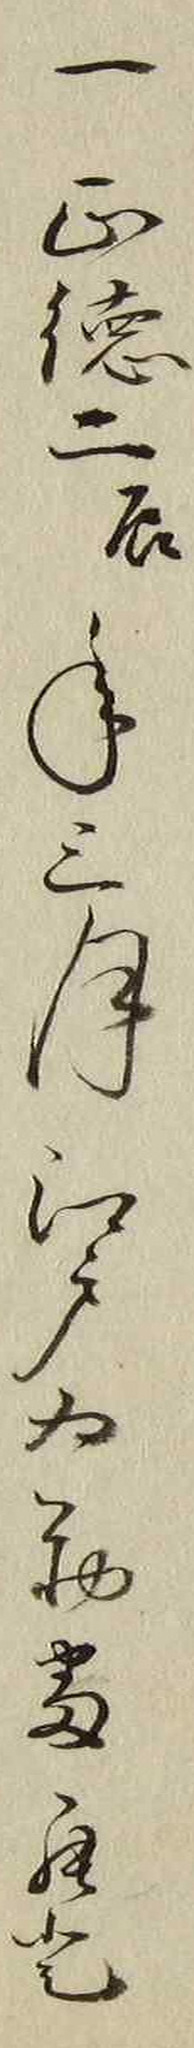一正徳二辰年三月江戸為勤番罷登
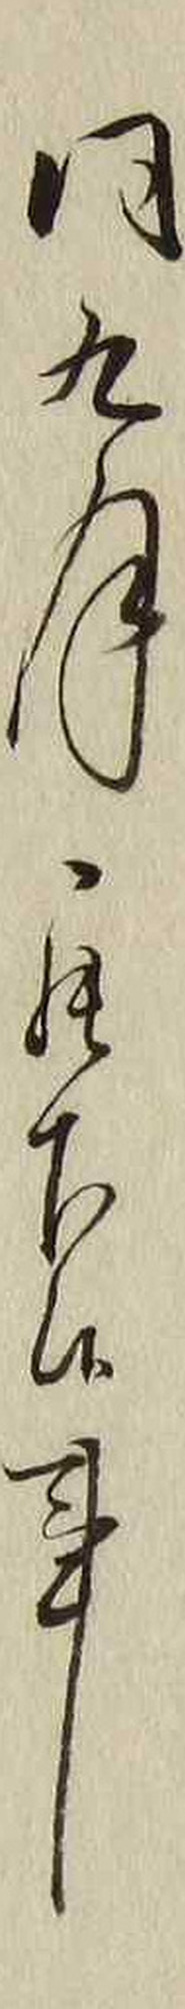同九月罷下候事
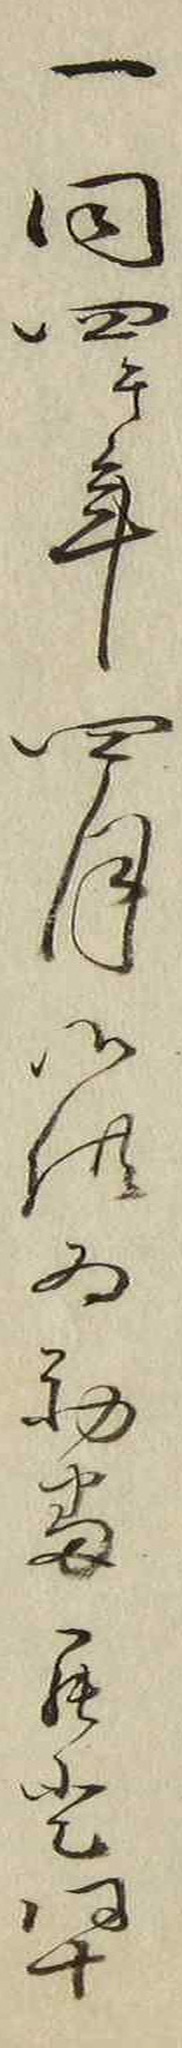一同四午年四月御供為勤番罷登同十
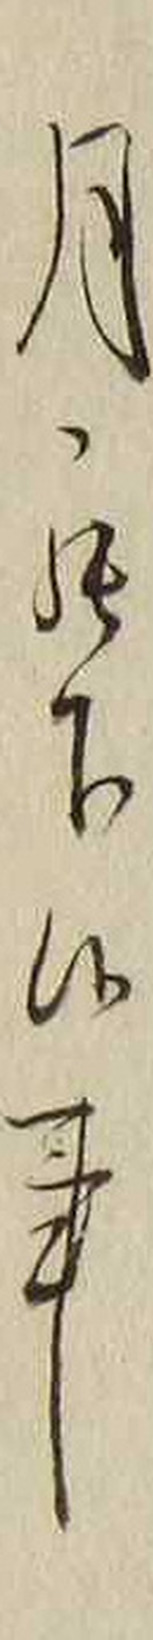月罷下候事

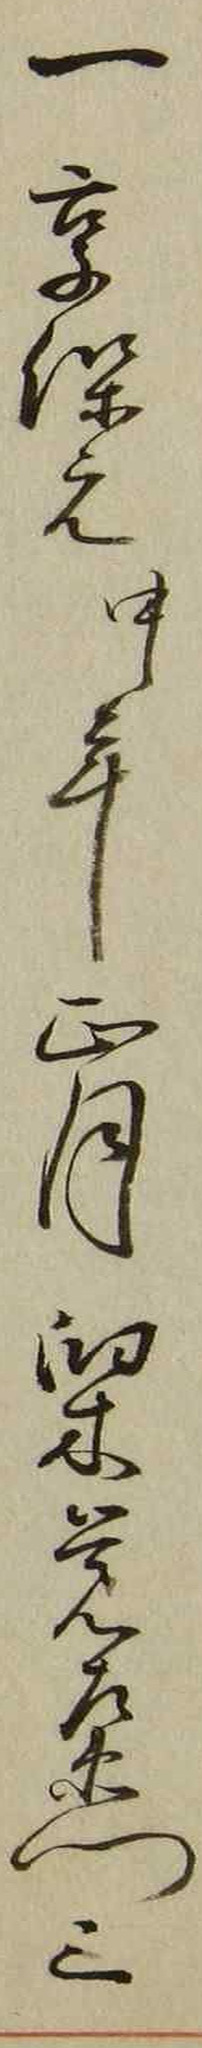一享保元申年正月臼木覚左衛門三
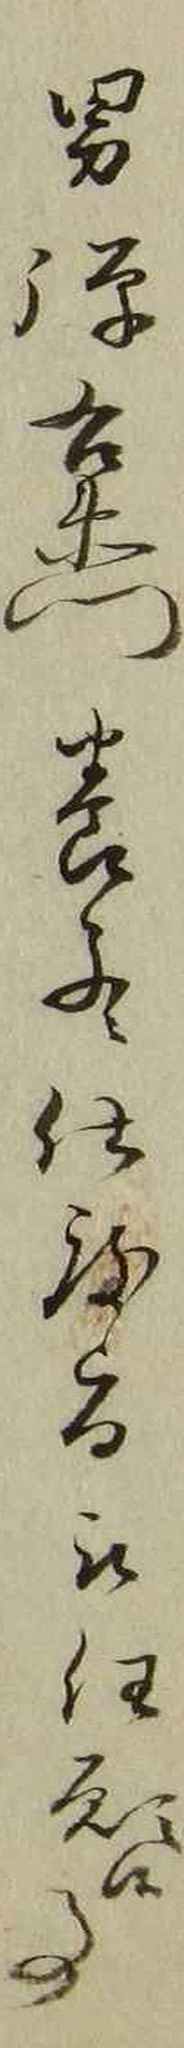男源右衛門養子ニ仕度旨被任願候事
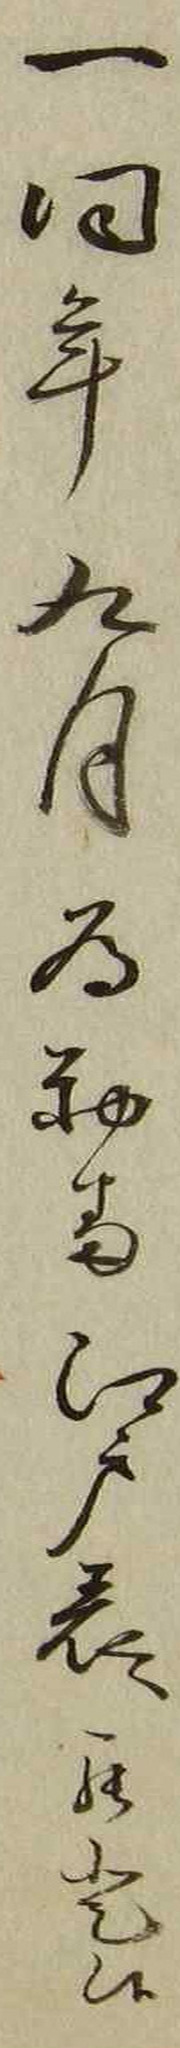一同年九月為勤番江戸表へ罷登候
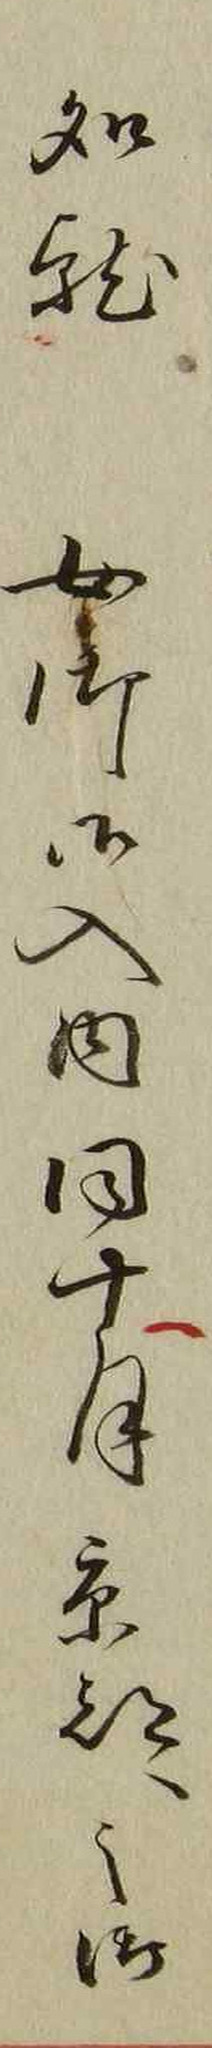処就女御御入内同十一月京都へ之御
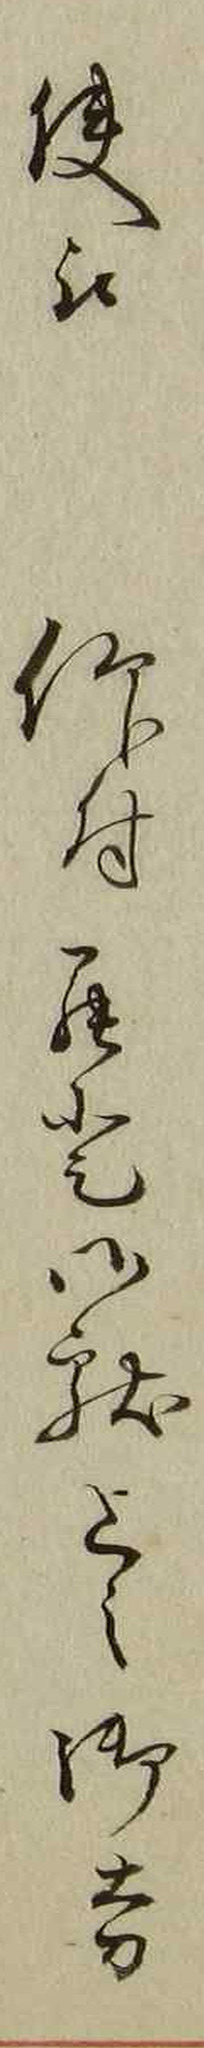使被仰付罷登御献上之御大刀
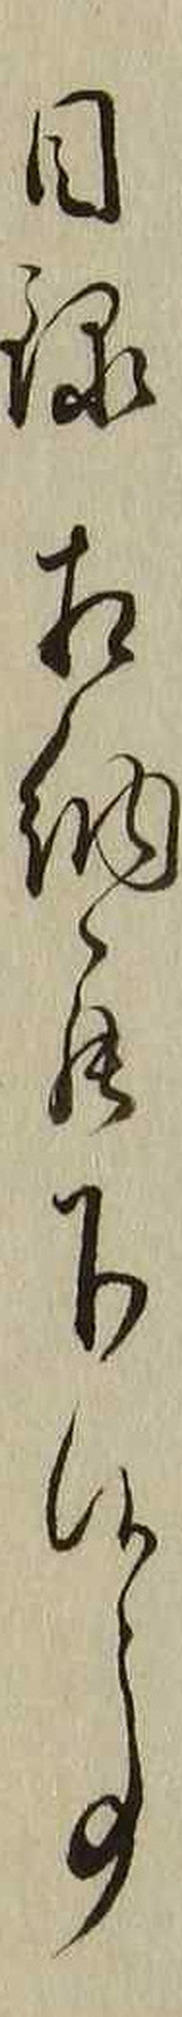目録相納罷下候事
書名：諸士系譜　巻之2　い之部2
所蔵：会津若松市立会津図書館
